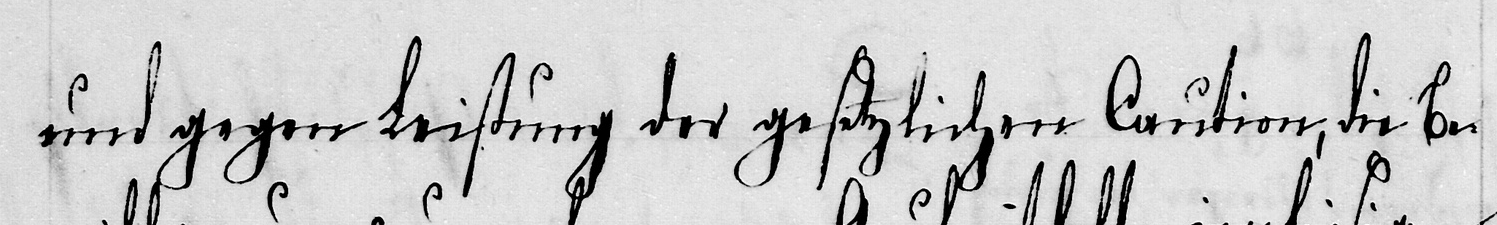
und gegen Leistung der gesetzlichen Caution, die B¬
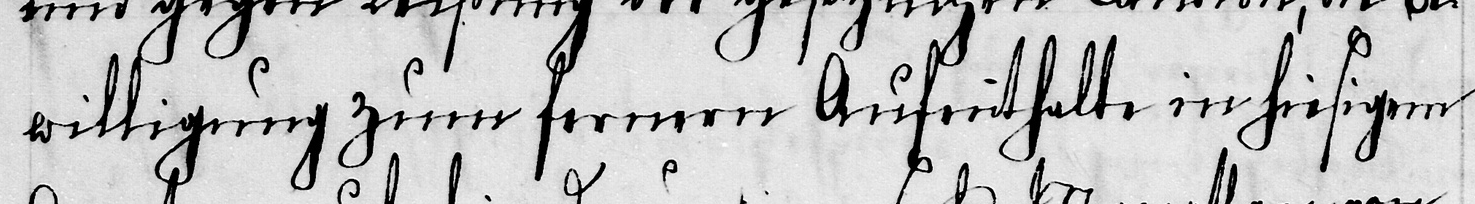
ewilligung zum fernern Aufenthalte in hiesigem
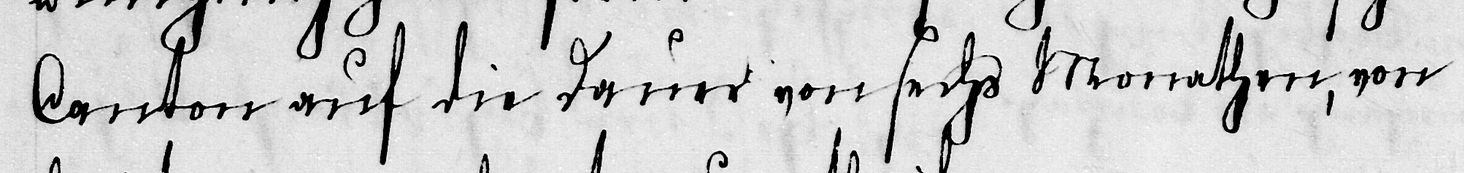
Canton auf die Dauer von sechs Monathen, von
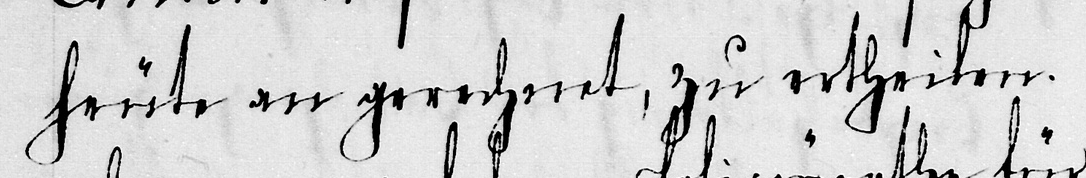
heute an gerechnet, zu ertheilen.
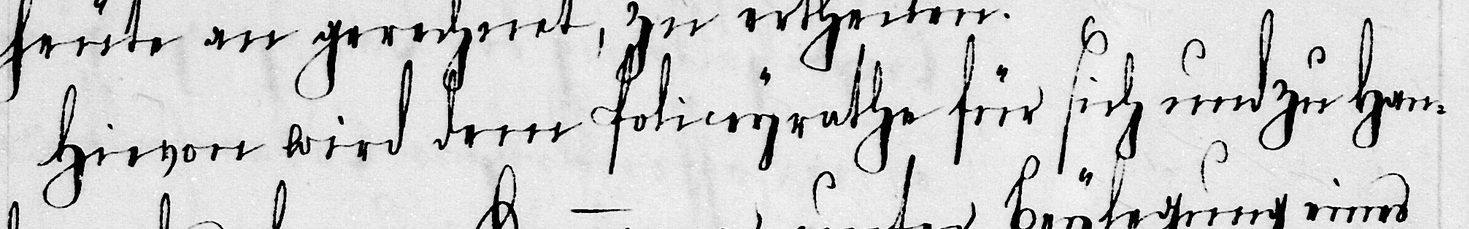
Hievon wird dem Policeyrathe für sich und zu Han¬
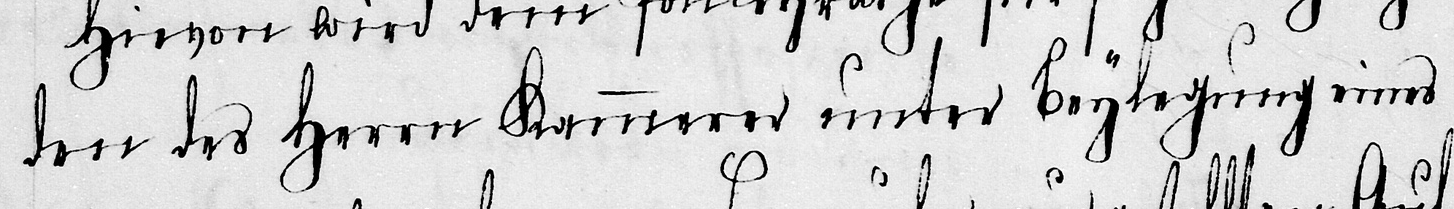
den des Herrn Kammerer unter Beylegung eines
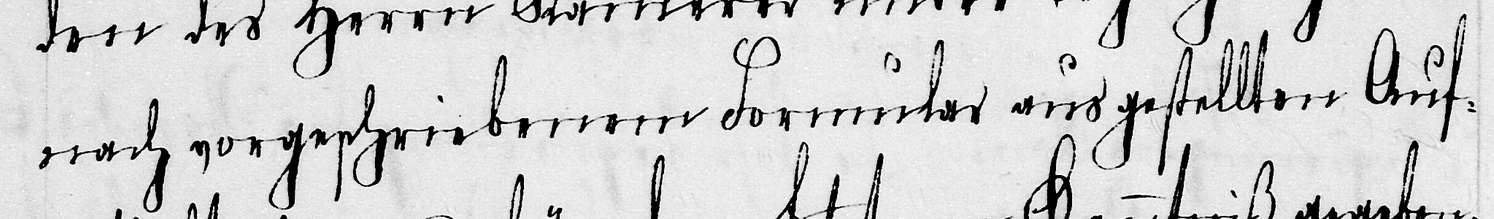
nach vorgeschriebenem Formular ausgestellten Auf¬
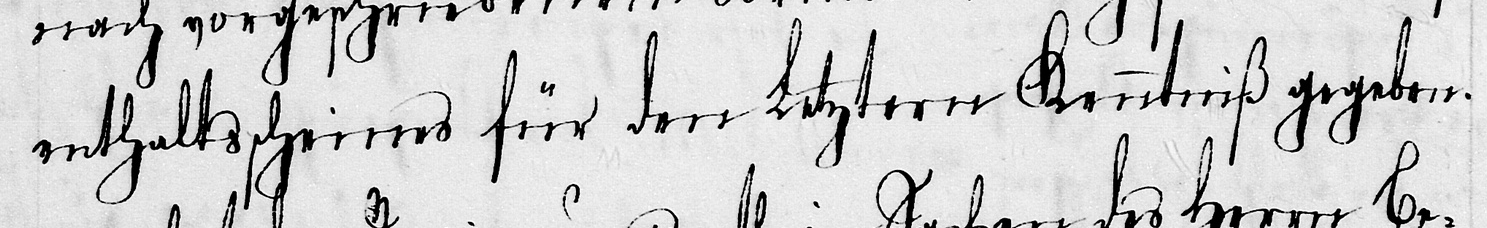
enthaltsscheines für den Letztern Kenntniß gegeben.
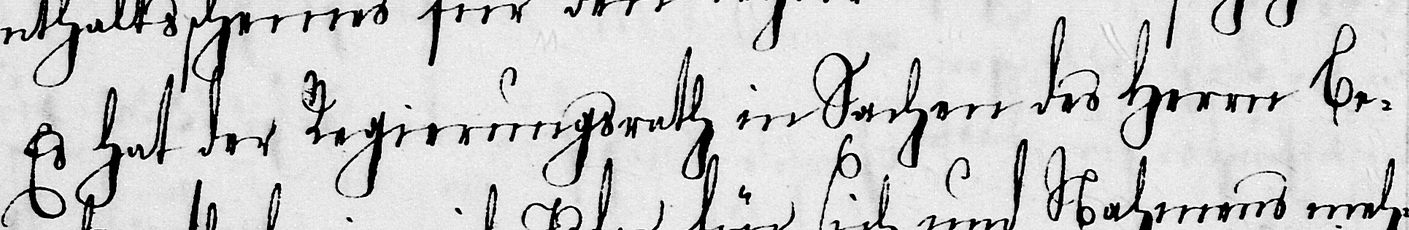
Es hat der Regierungsrath in Sachen des Herrn Be¬
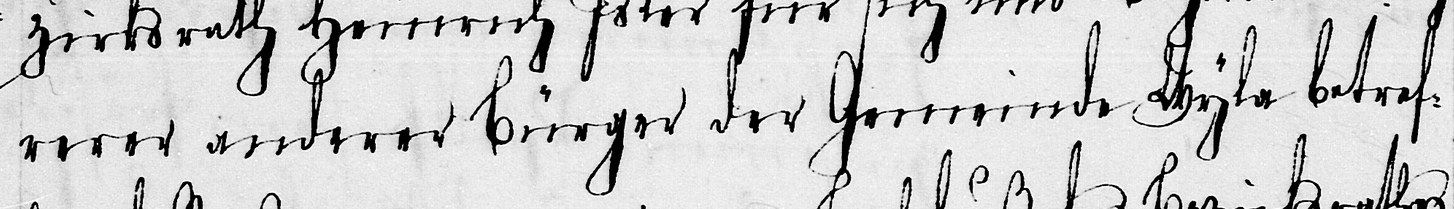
rerer anderer Bürger der Gemeinde Wyla betref¬
